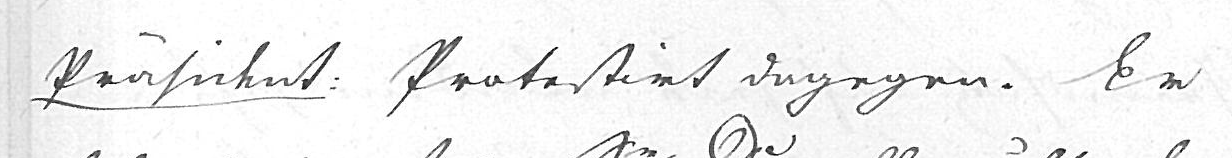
Präsident: Protestirt dagegen. Er
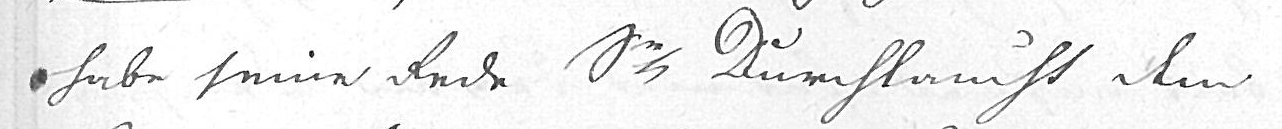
habe seine Rede Sr. Durchlaucht dem
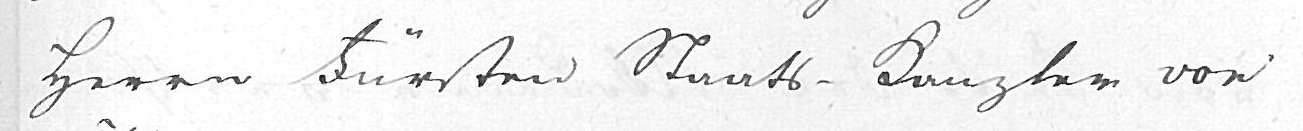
Herrn Fürsten Staats-Kanzler von
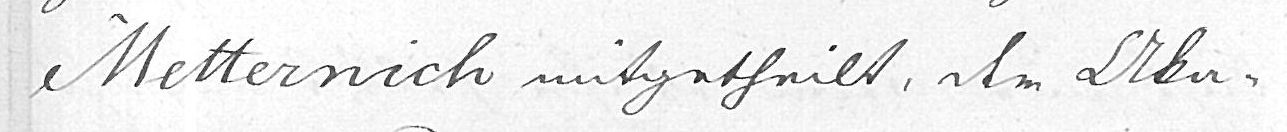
Metternich mitgetheilt, der Aka-
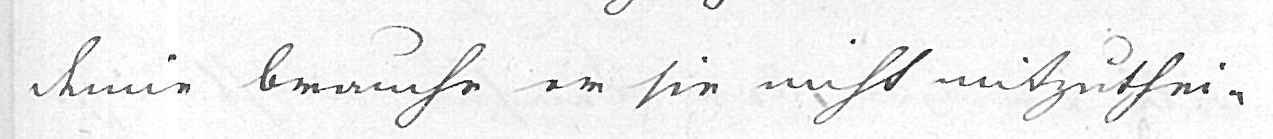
demie brauche er sie nicht mitzuthei-
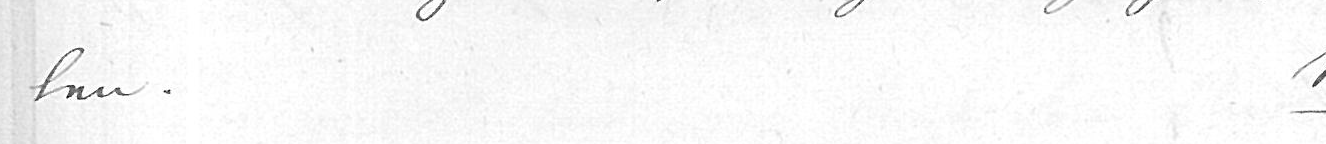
len.
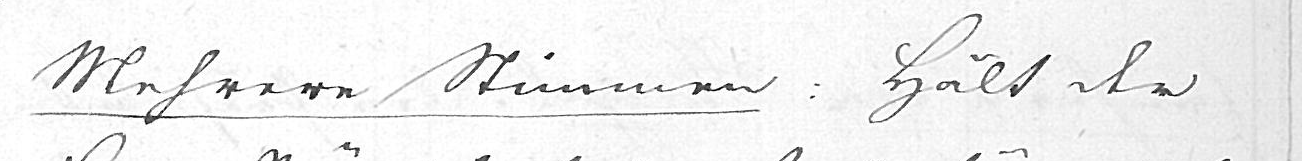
Mehrere Stimmen: Hält der
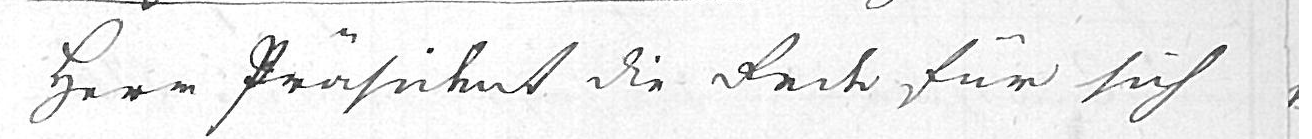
Herr Präsident die Rede für sich
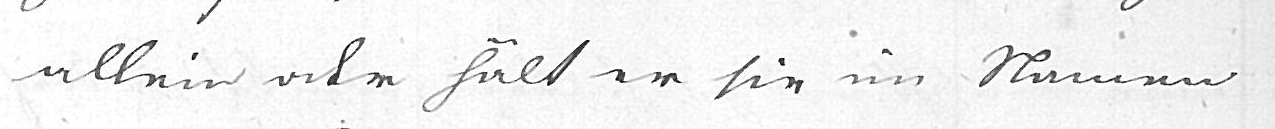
allein oder hält er sie im Namen
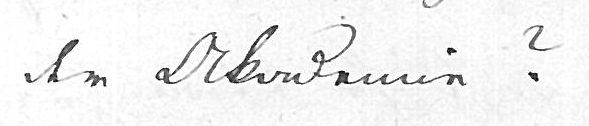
der Akademie?
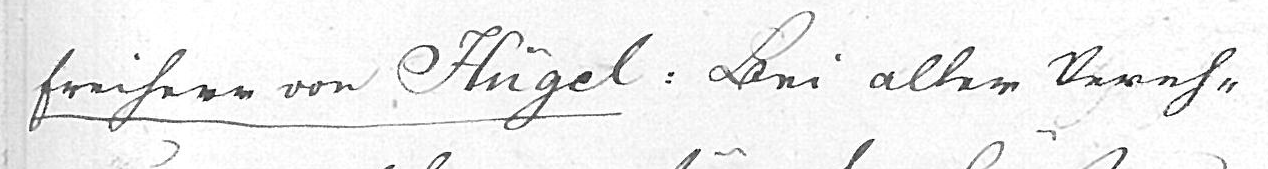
Freiherr von Hügel: Bei aller Vereh-
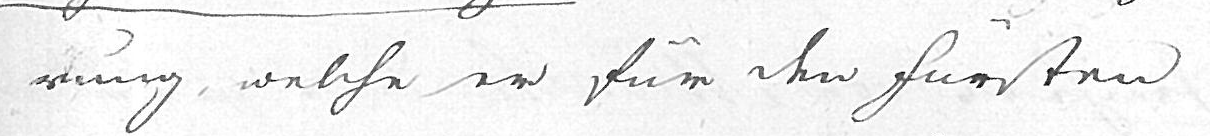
rung, welche er für den Fürsten
